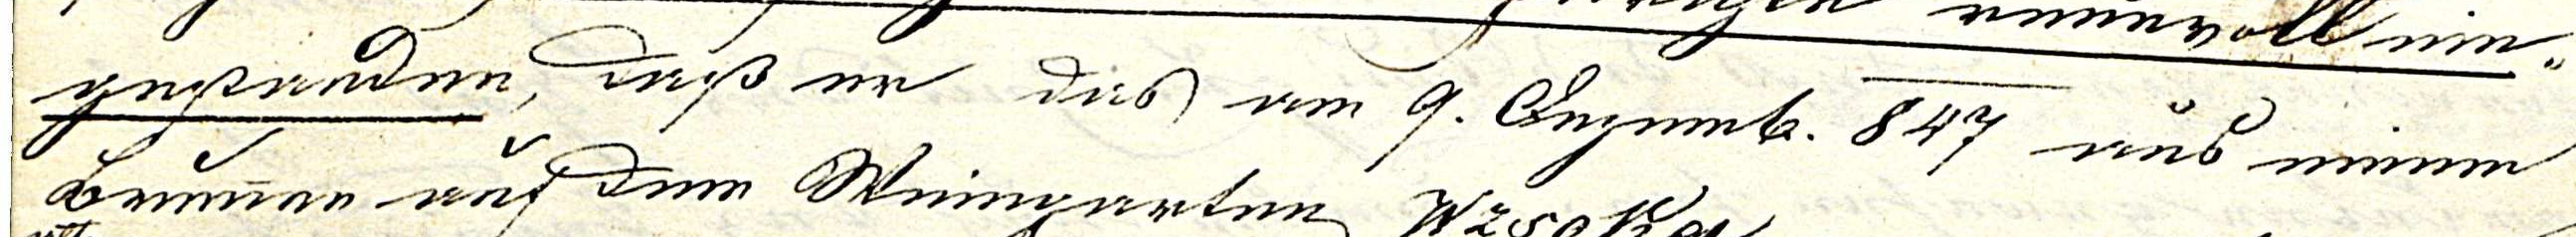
gestanden, daß er das am 9. Dezember [1]847 aus einem
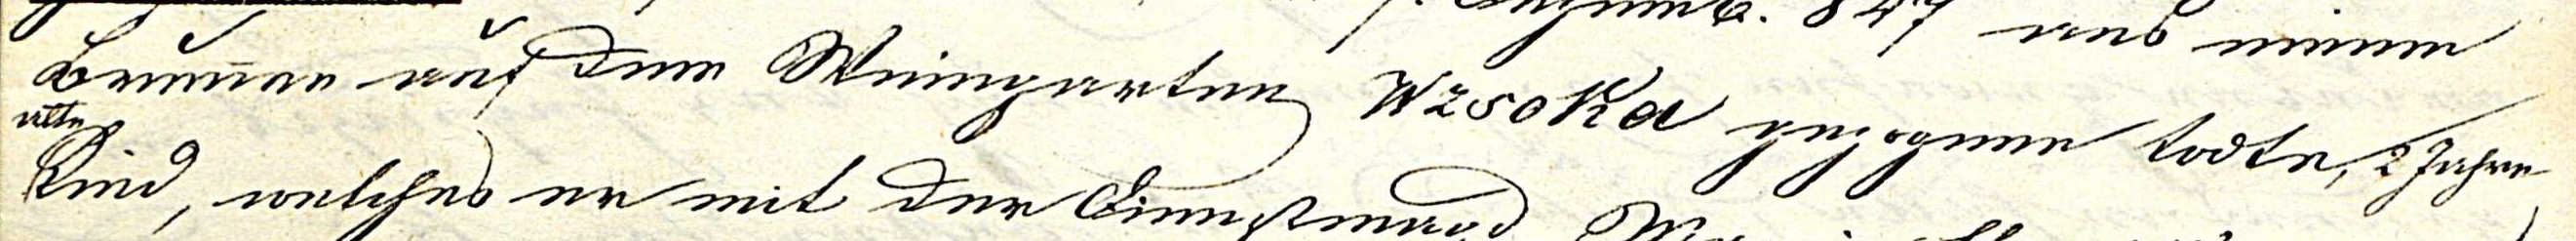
Breunnen auf dem Weingarten Wzsoka gezogener todte, 2 Jahre
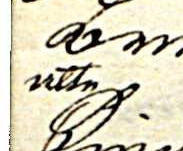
Alte
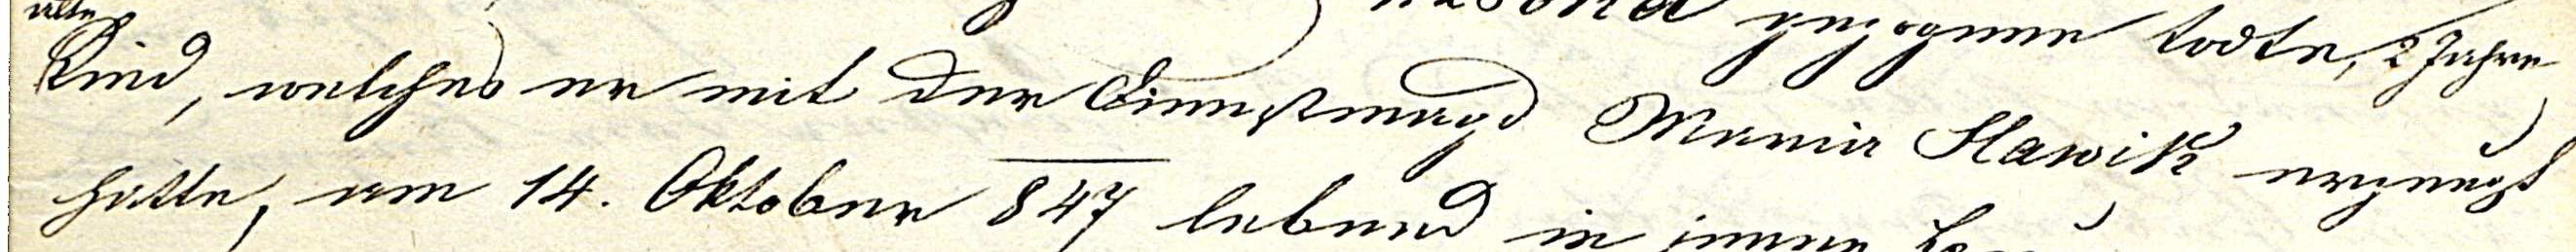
Kind, welches er mit der Dienstmagd Maria Hawik erzeugt
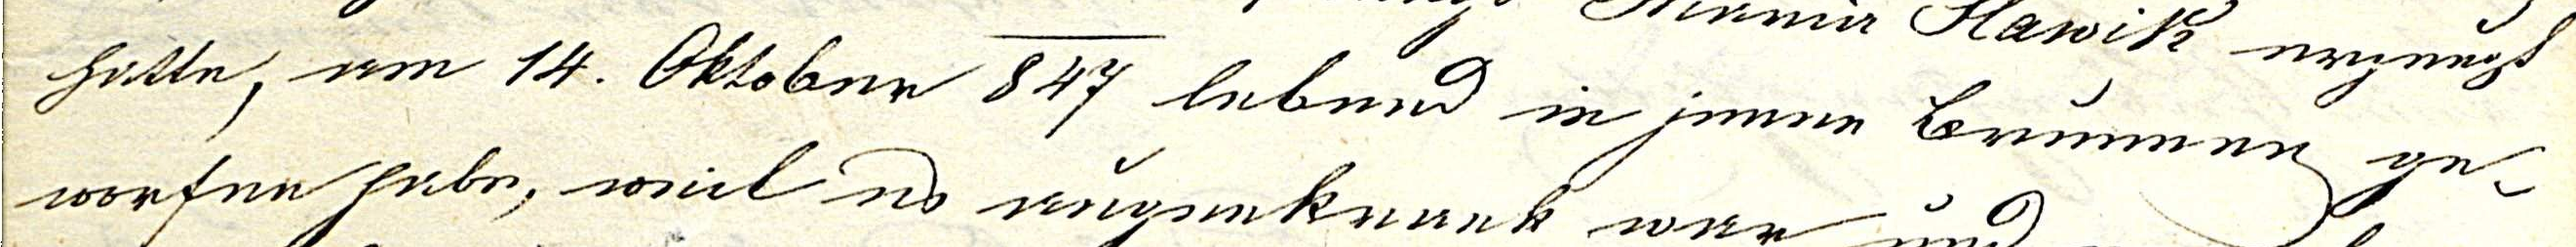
hatte, am 14. Oktober [1]847 lebend in jener Brunnen ge¬
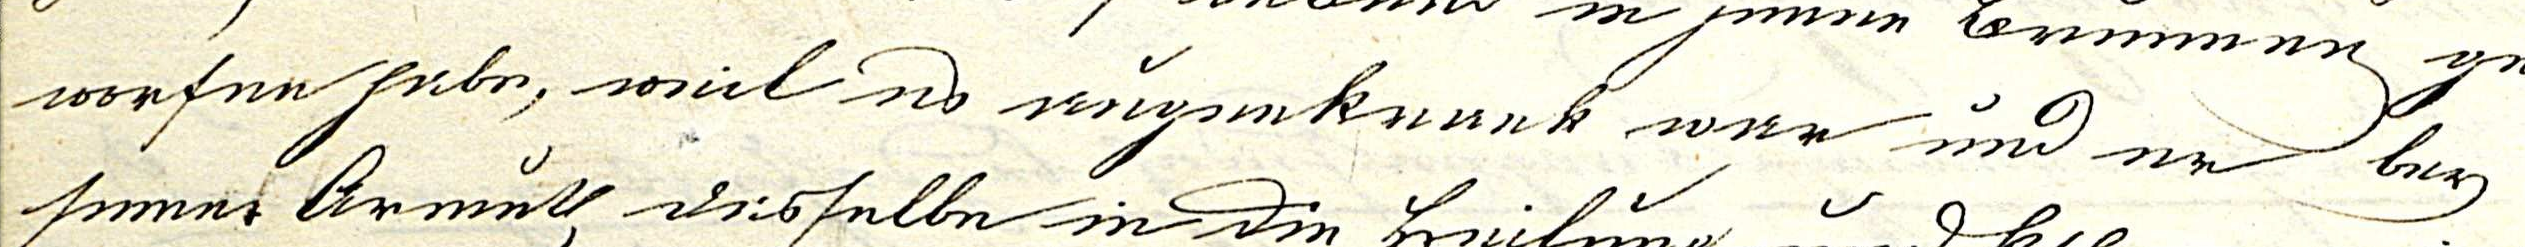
worfen habe, weil es augenkrank war und er bey
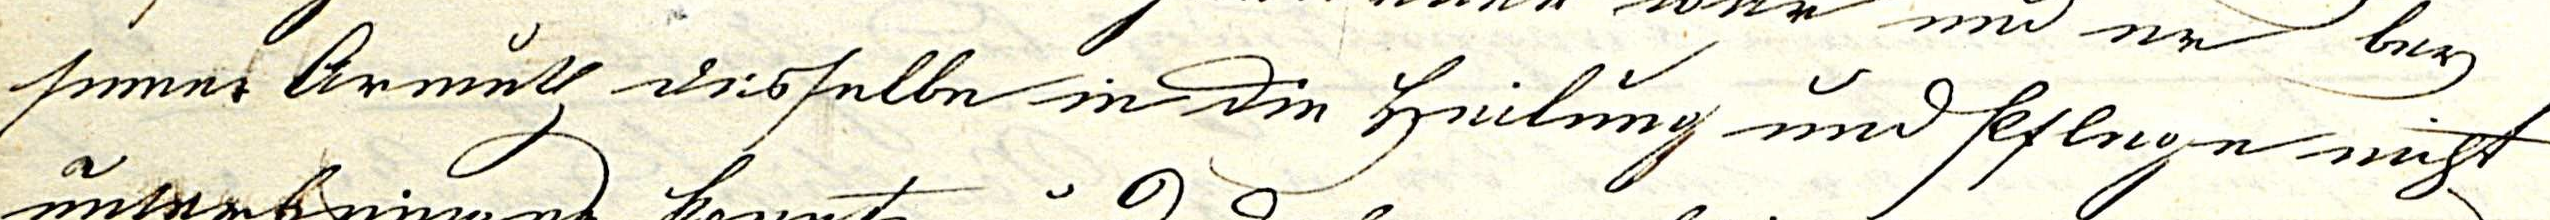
seiner Armuth dasselbe in die Heilung und Pflege nicht
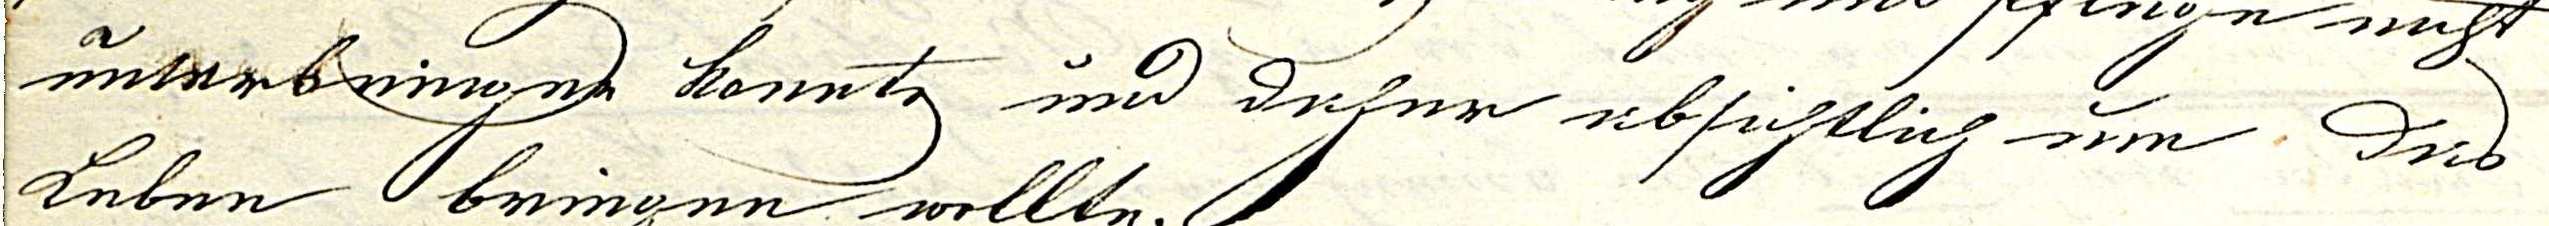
unterbringen konnte und daher absichtlich um das
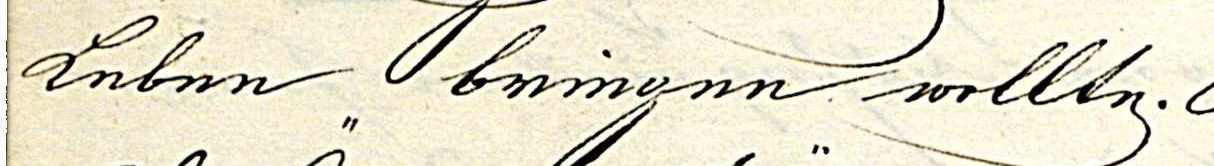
Leben bringen wollte.
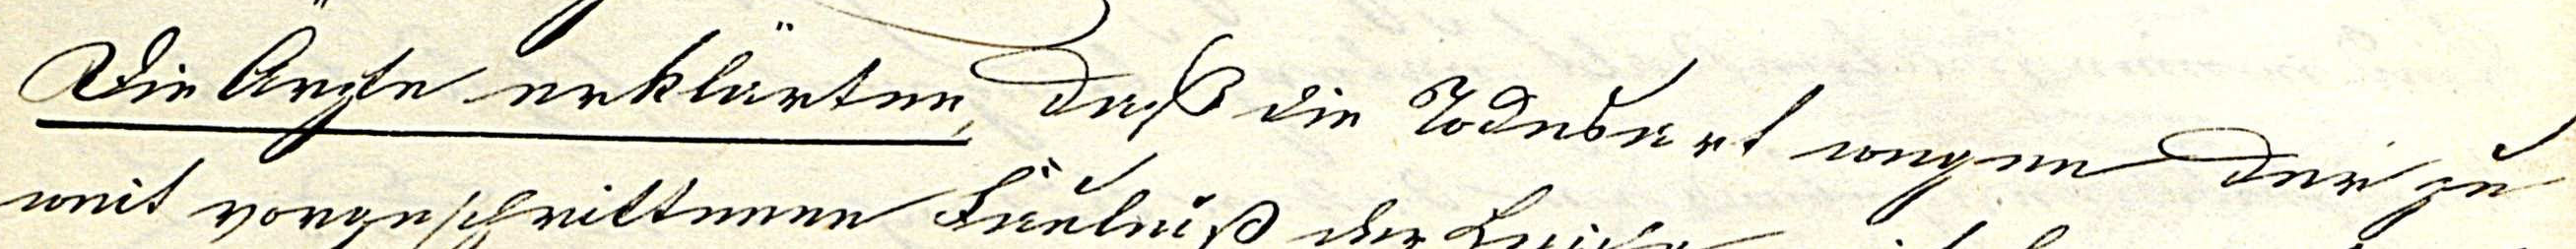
Die Ärzte erklärten daß die Todesart wegen der zu
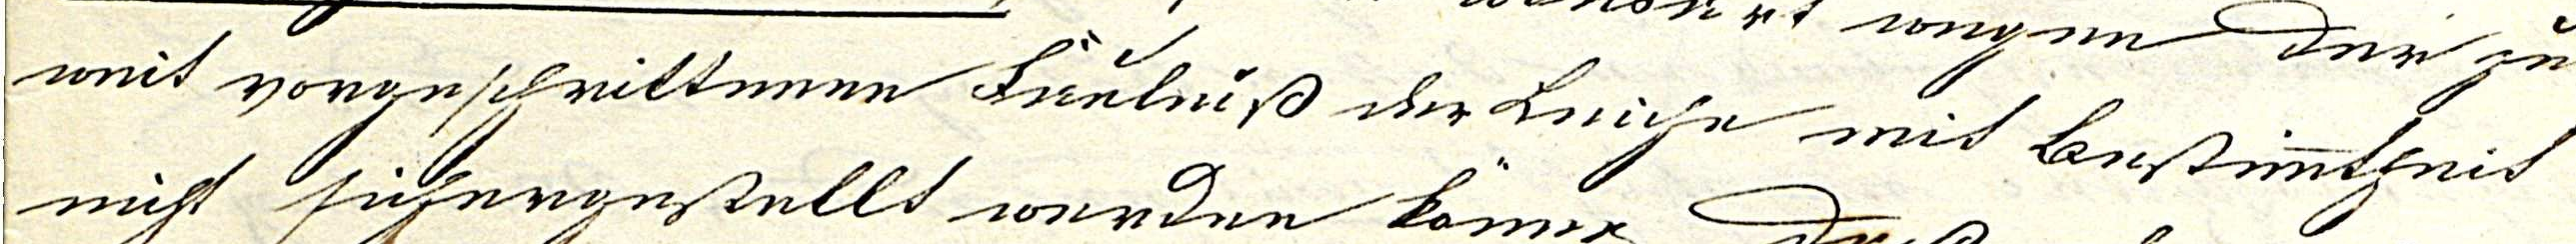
weit vorgeschrittenen Fäulniß der Leiche mit Bestimmtheit
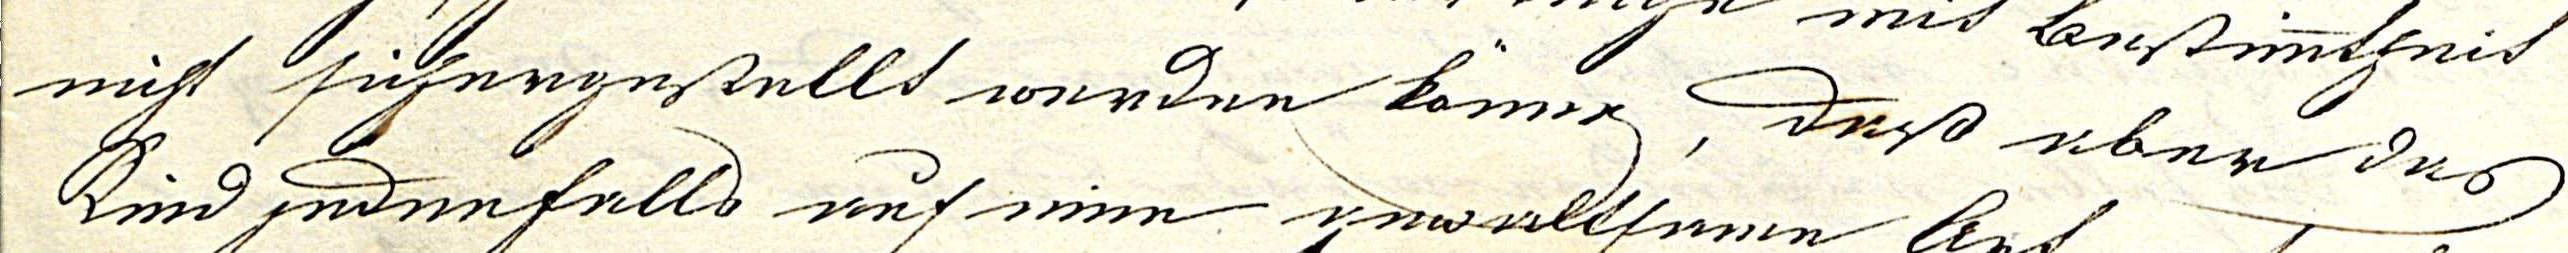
nicht sichergestellt werden könne, daß aber das
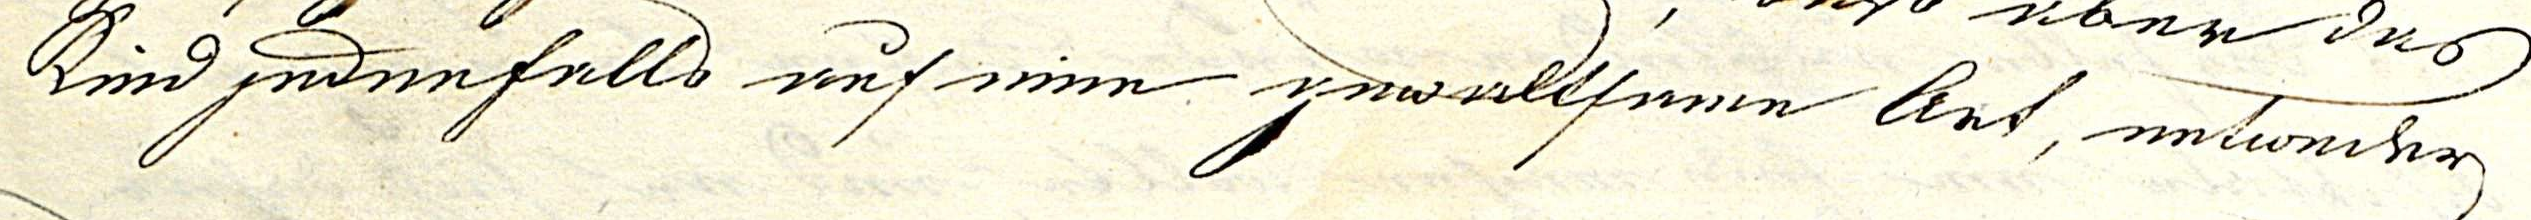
Kind jedenfalls auf eine gewaltsame Art, entweder
